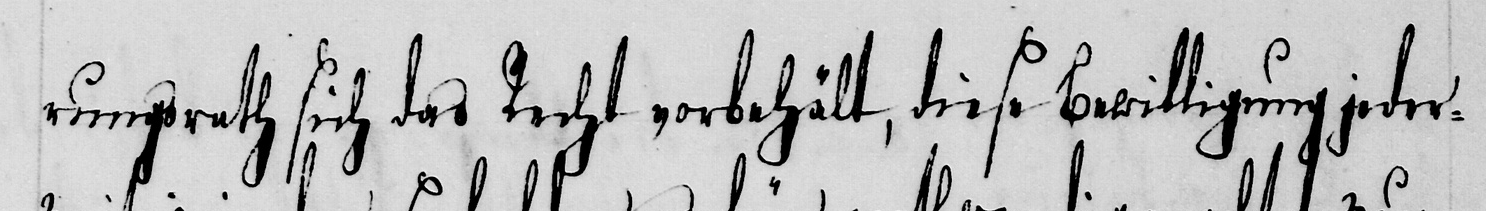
rungsrath sich das Recht vorbehält, diese Bewilligung je¬
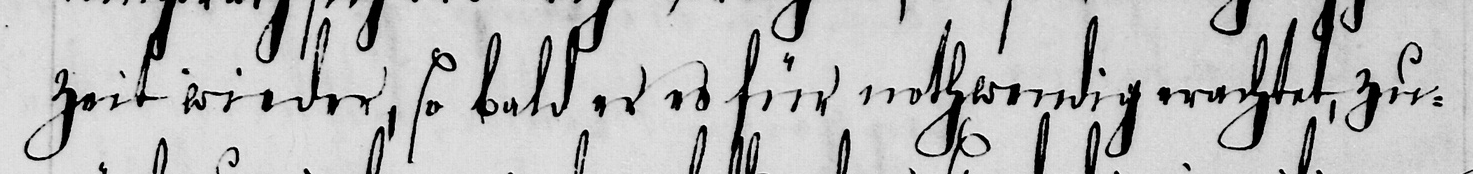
zeit wieder, so bald er es für nothwendig erachtet, zu¬
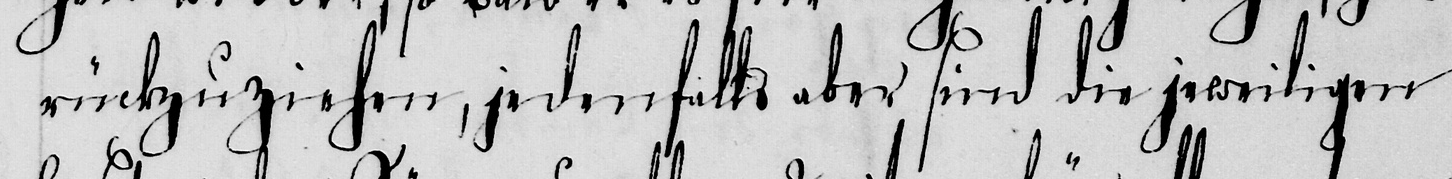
rückzuziehen, jedenfalls aber sind die jeweiligen
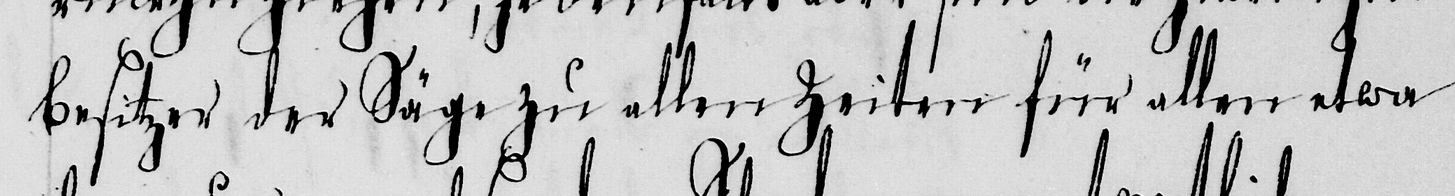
Besitzer der Säge zu allen Zeiten für allen etwa
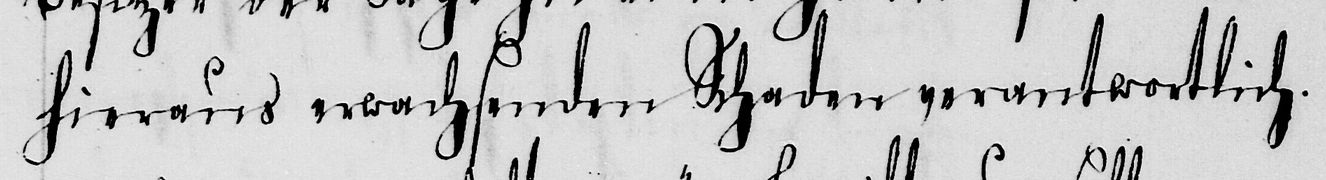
hieraus erwachsenden Schaden verantwortlich.
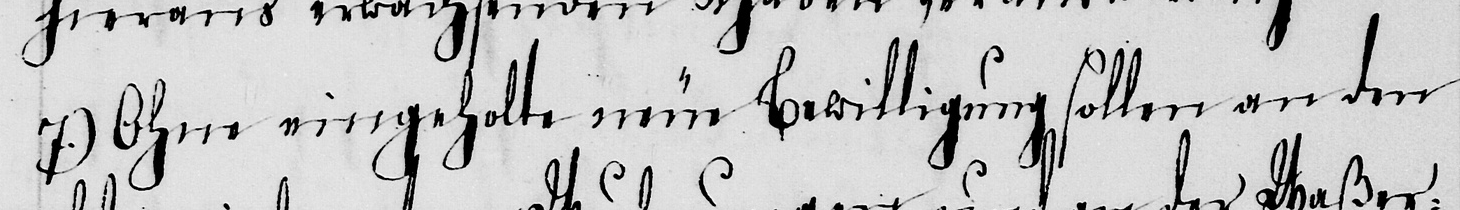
7.) Ohne eingeholte neue Bewilligung sollen an den
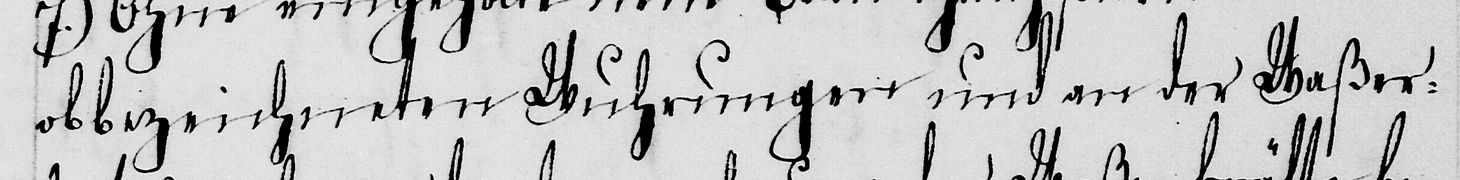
obbezeichneten Wuhrungen und an der Waßer¬
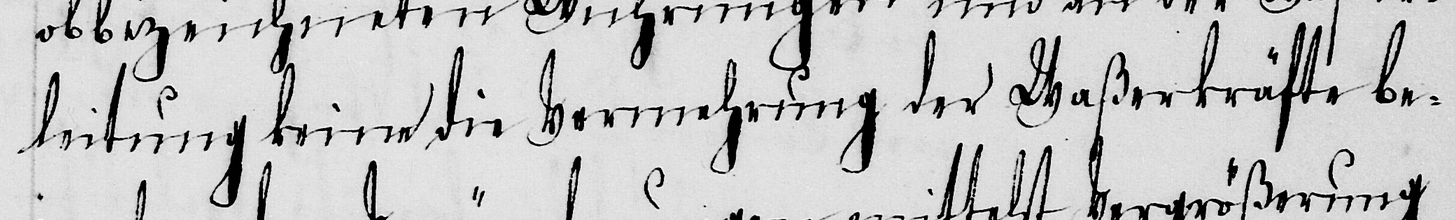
leitung keine die Vermehrung der Waßerkräfte be¬
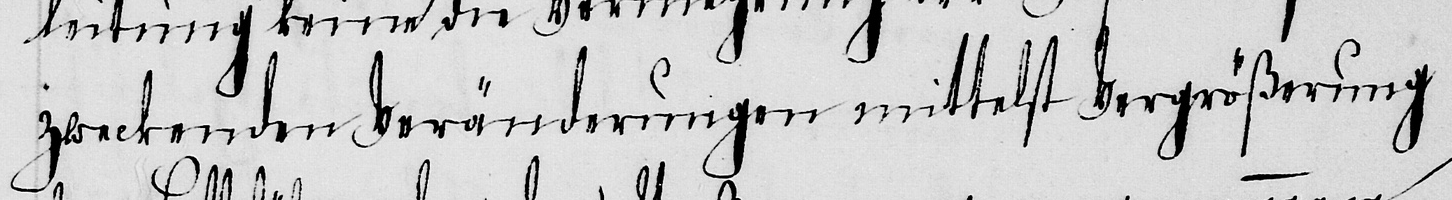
zweckenden Veränderungen mittelst Vergrößerung
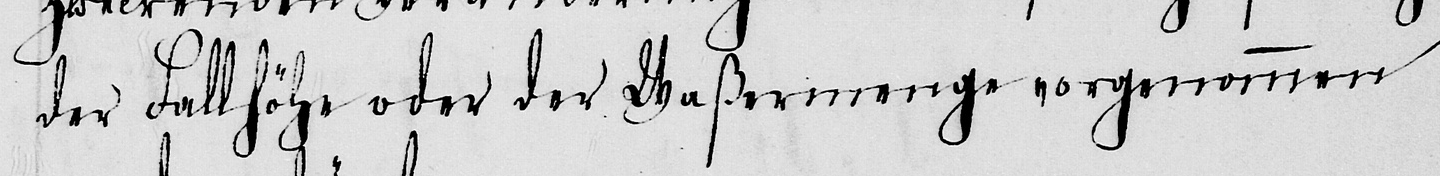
der Fallhöhe oder der Waßermenge vorgenommen
